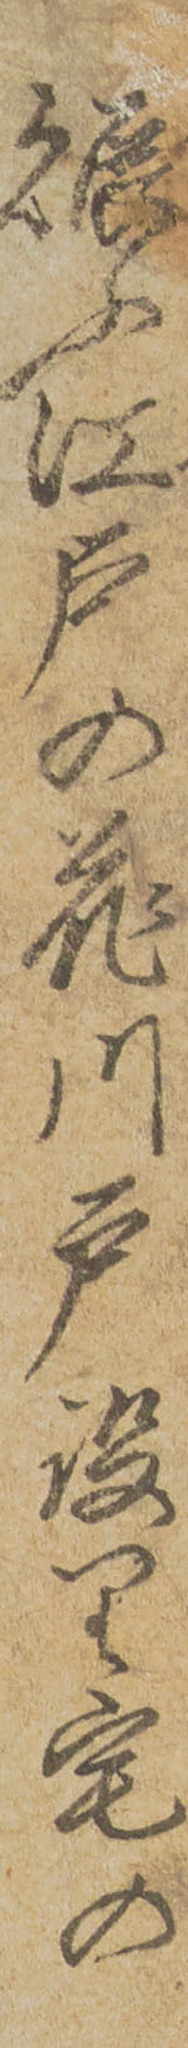賑ふ江戸の花川戸設り宅の
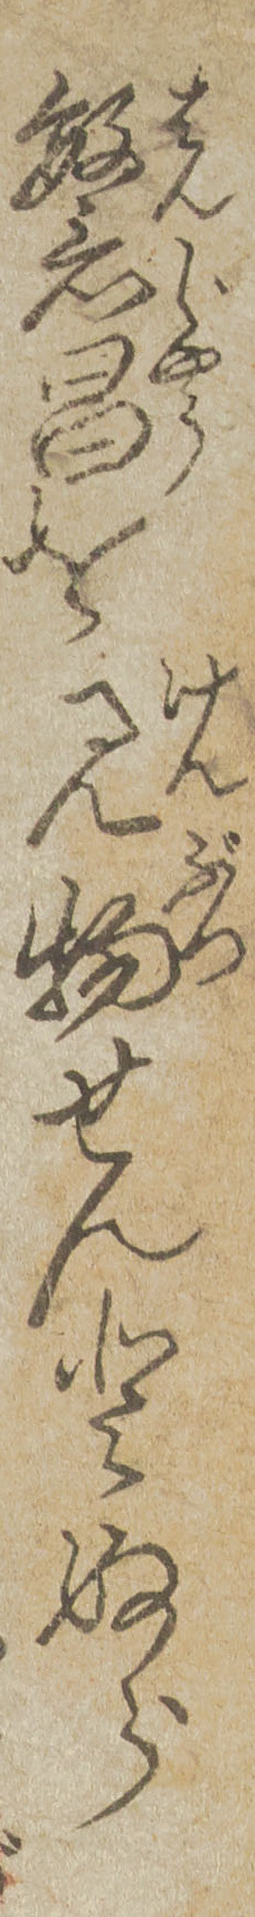繁昌を見物せんとぬら
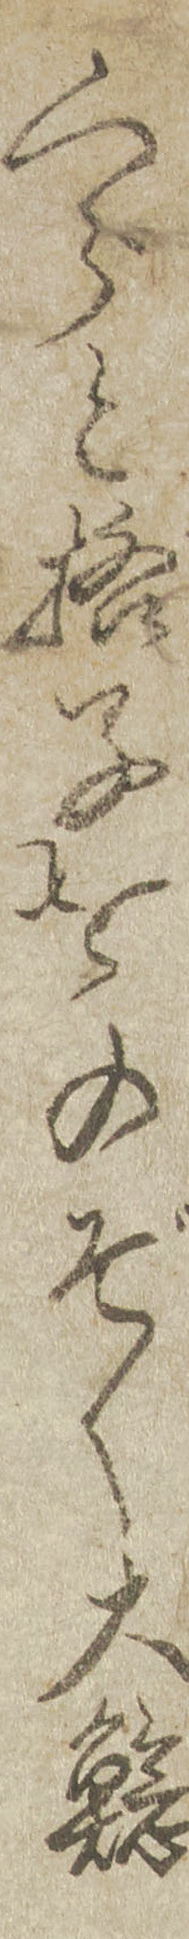くらと格子をのぞく大鯰
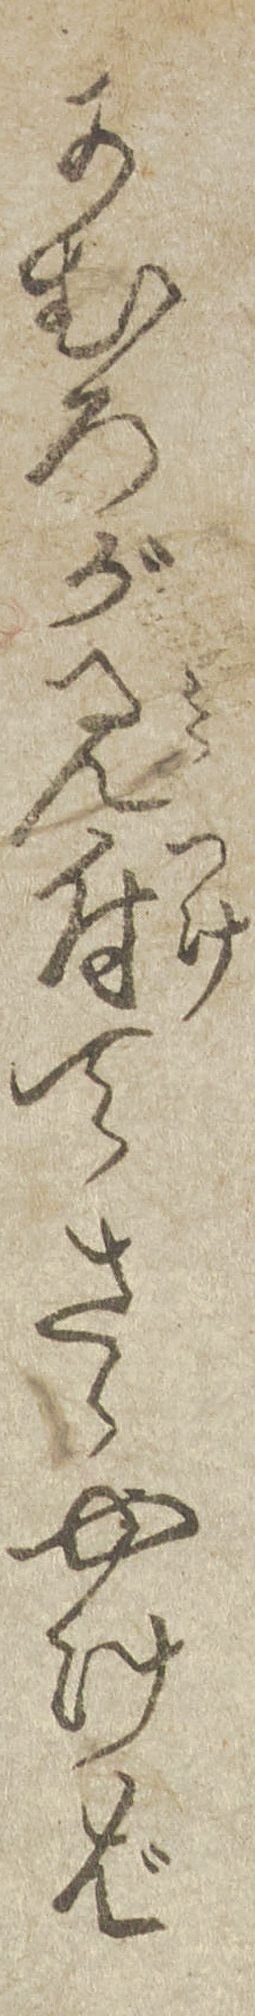かむろが見付てさゝやけば
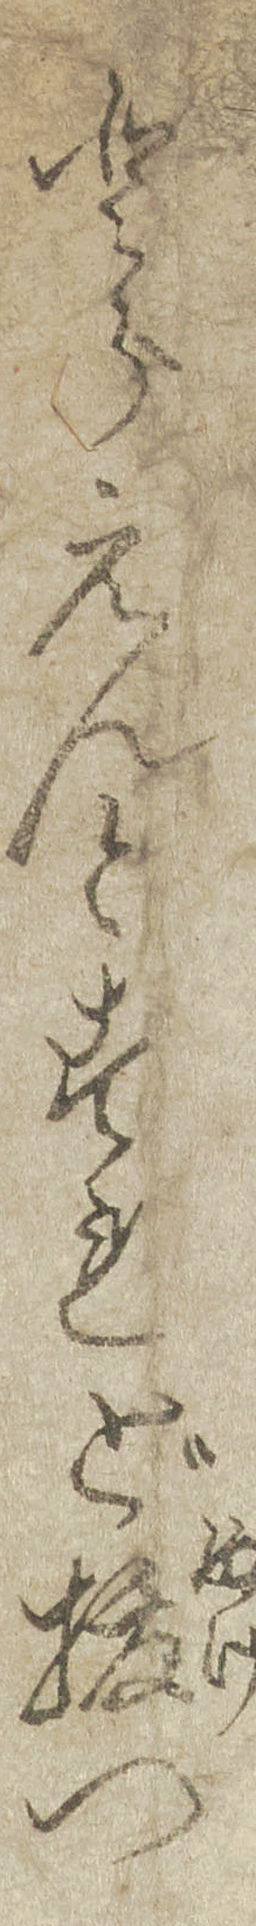とらえんとすれど抜つ
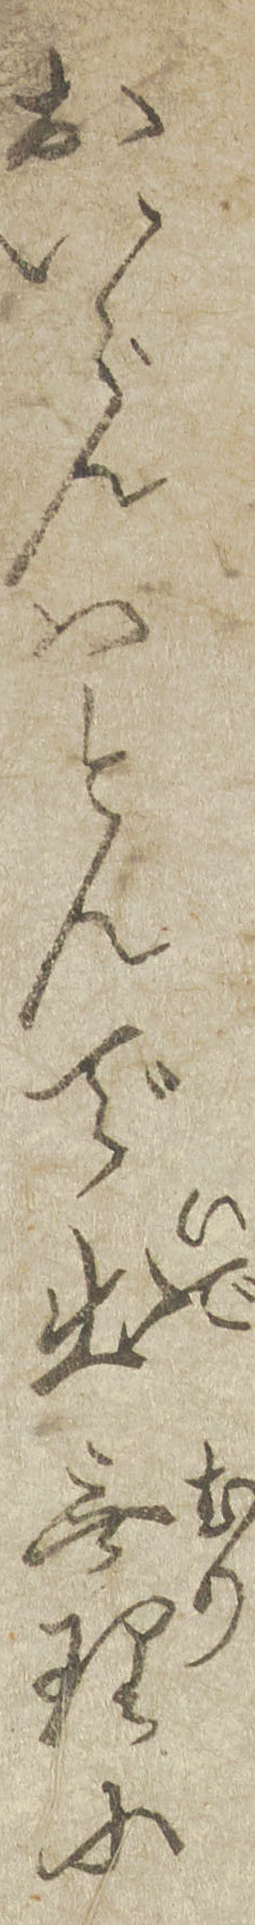おいらんはとんで出無理に
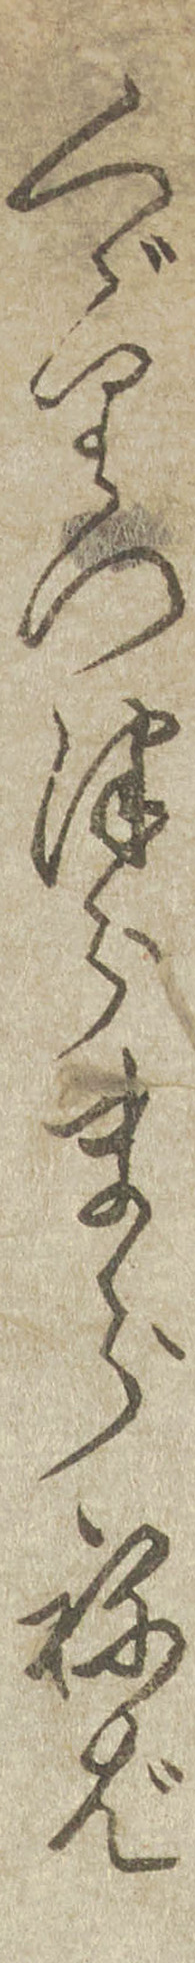くゞりつつらまらねば
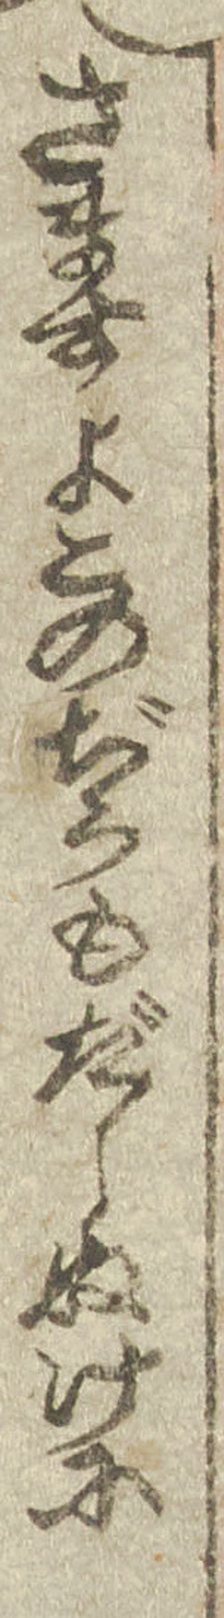さますよこのぢうもだしぬけに
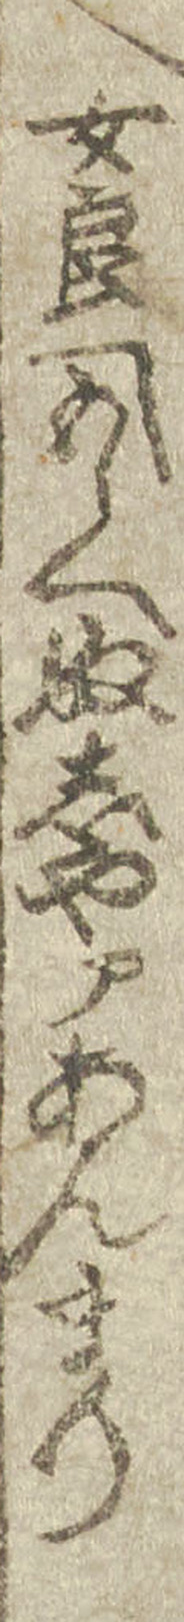女郎〽︎もしへぬしやアあんまり
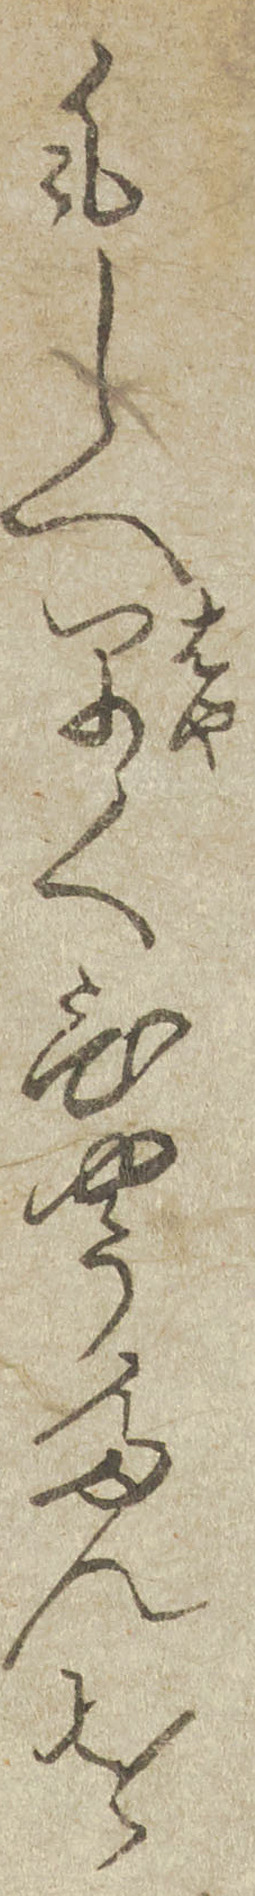もしへ早くひやうたんを
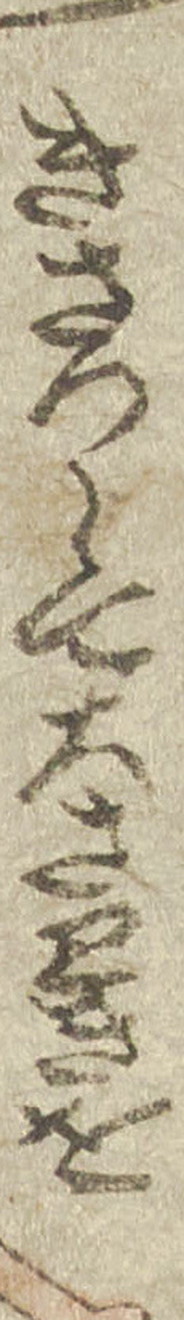きさつして大さわきを
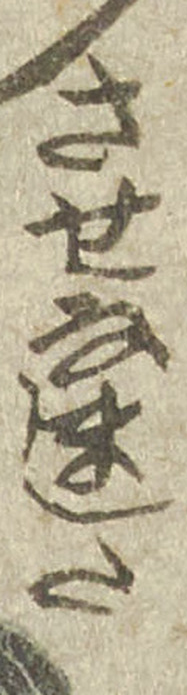させなました
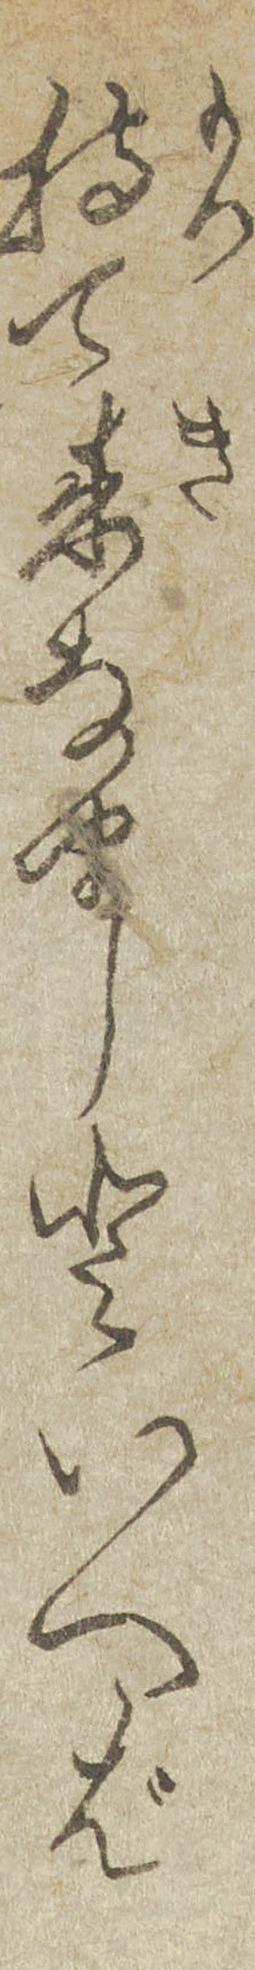持て来なましといへば
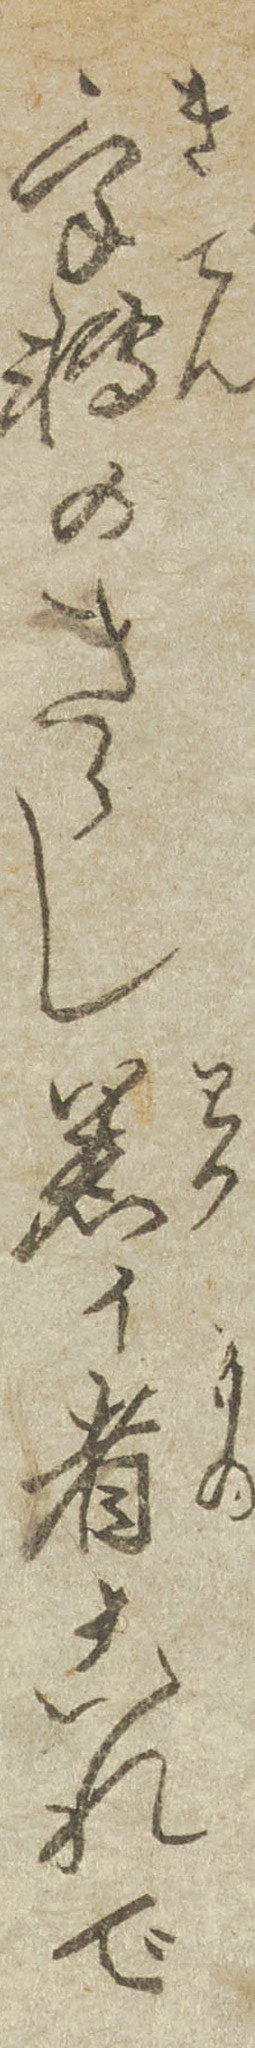気転のきゝし若イ者これで
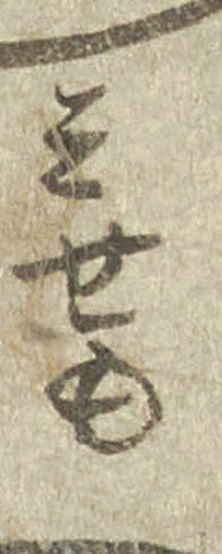みせも
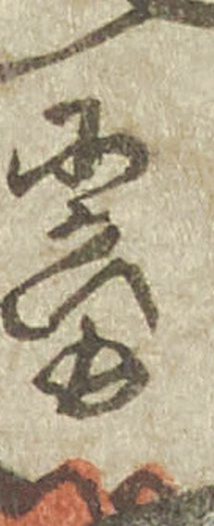にかいも
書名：治る御代ひやかし鯰
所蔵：東京大学総合図書館 General Library in the University of Tokyo, JAPAN
